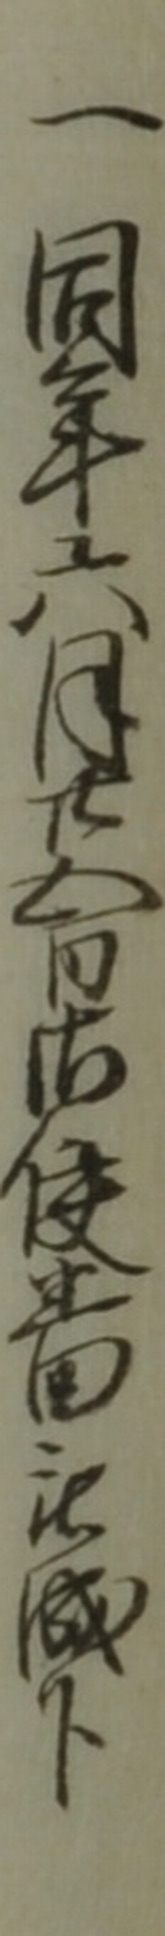一同年六月廿五日御使番被成下
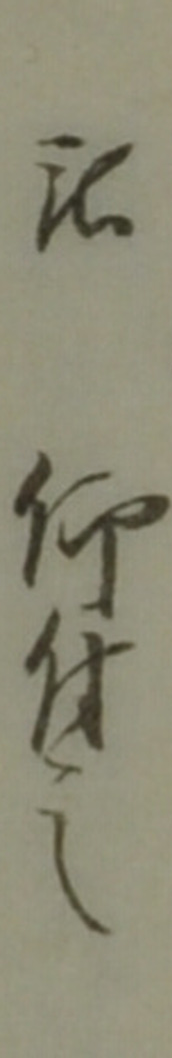被仰付之
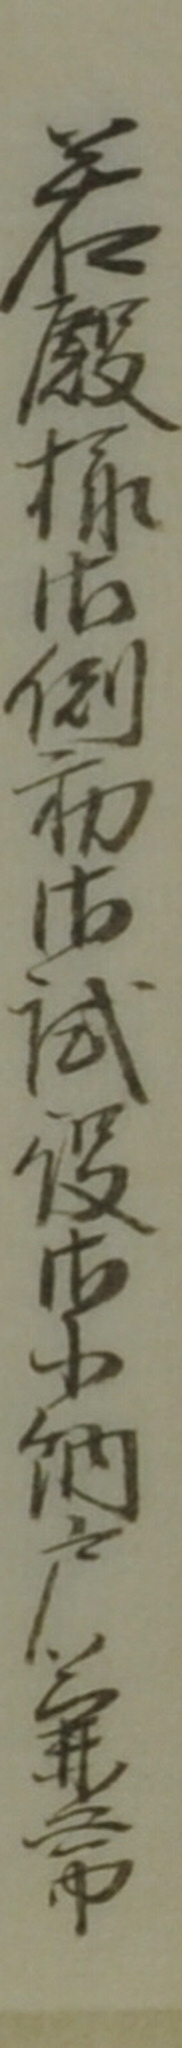若殿様御側勤御試役御小納戸兼帯
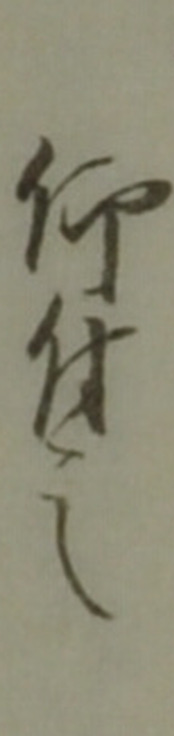仰付之
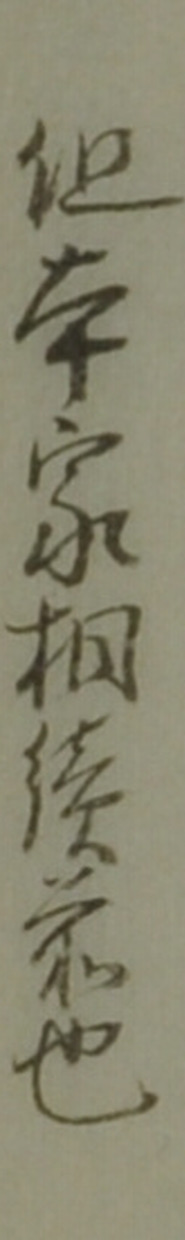但本家相続前也
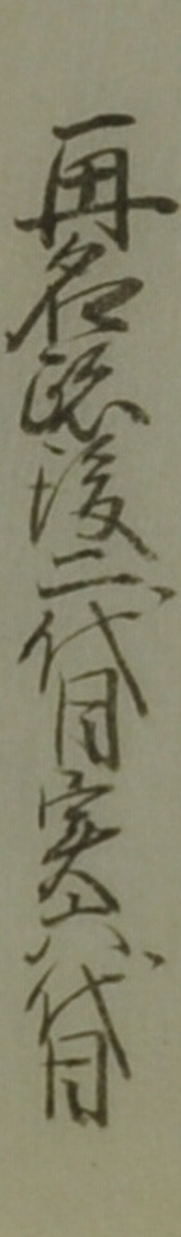再名跡後二代目実六代目
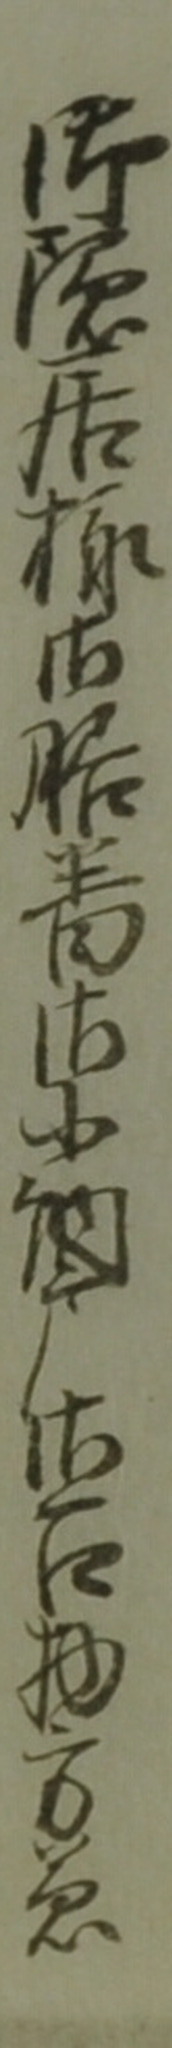御隠居様御膳番御小納戸御召物方兼
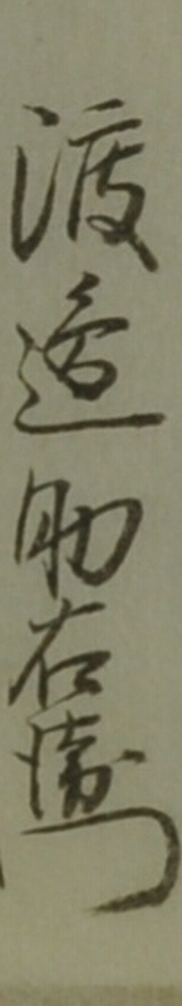渡辺助右衛門
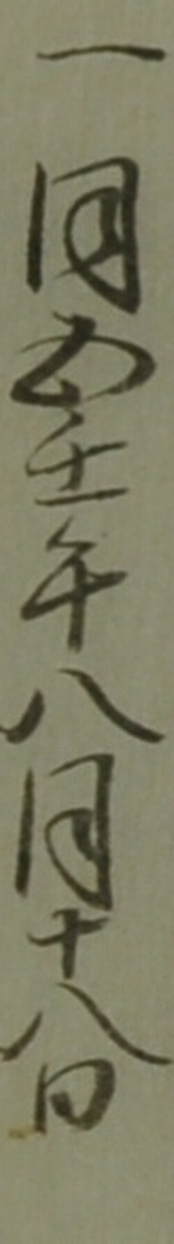一同五壬午八月十八日
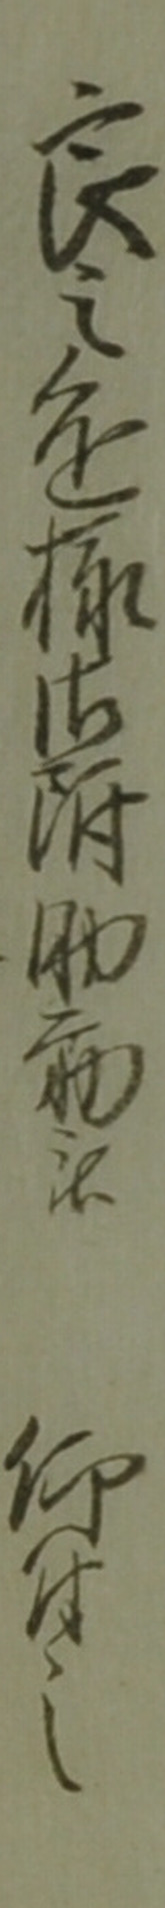良之進様御附助勤被仰付之
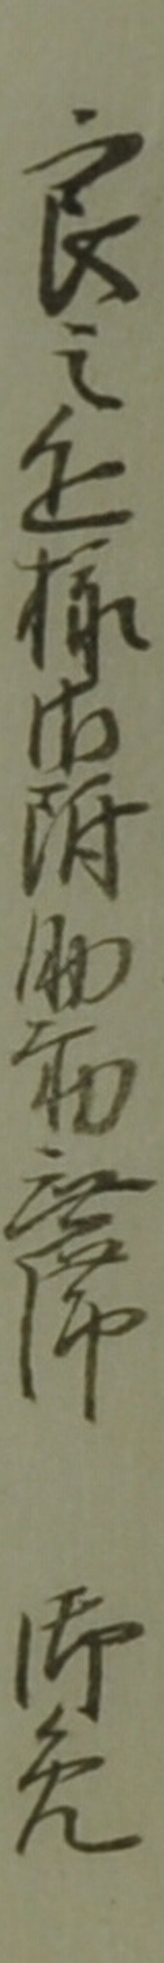良之進様御附助勤無滞御免
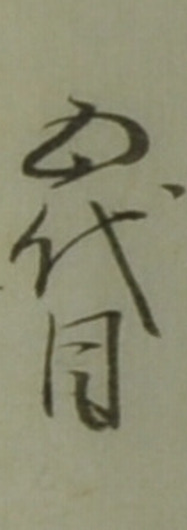五代目

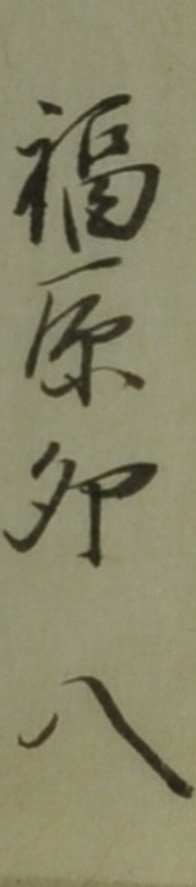福原卯八
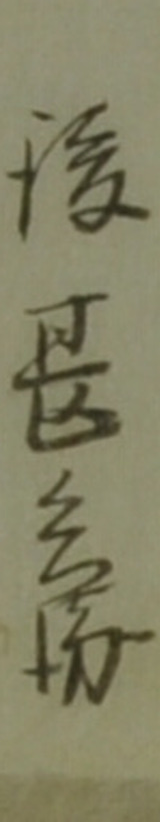後甚兵衛
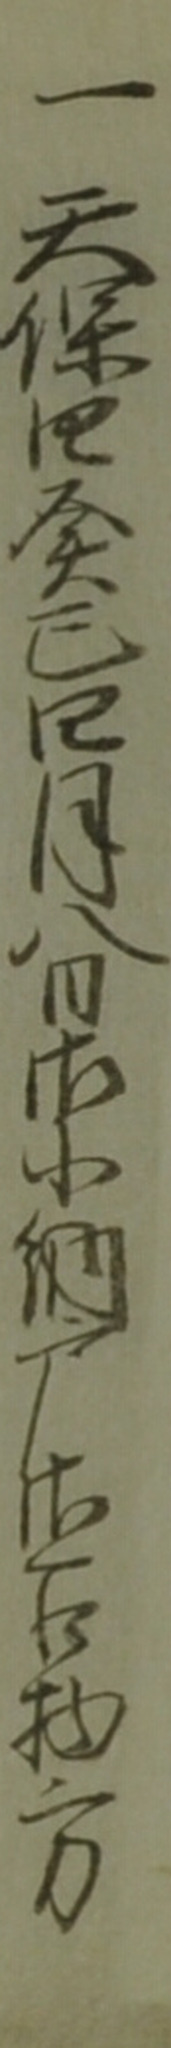一天保四癸巳四月八日御小納戸御召物方
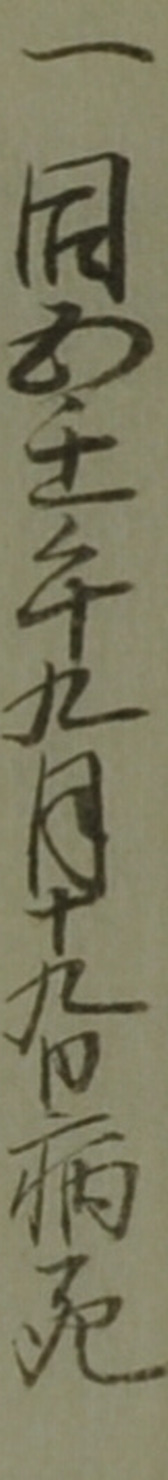一同五壬午九月十九日病死
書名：諸御役代々録（六）
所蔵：伊那市立高遠町図書館・合同会社AMANE
